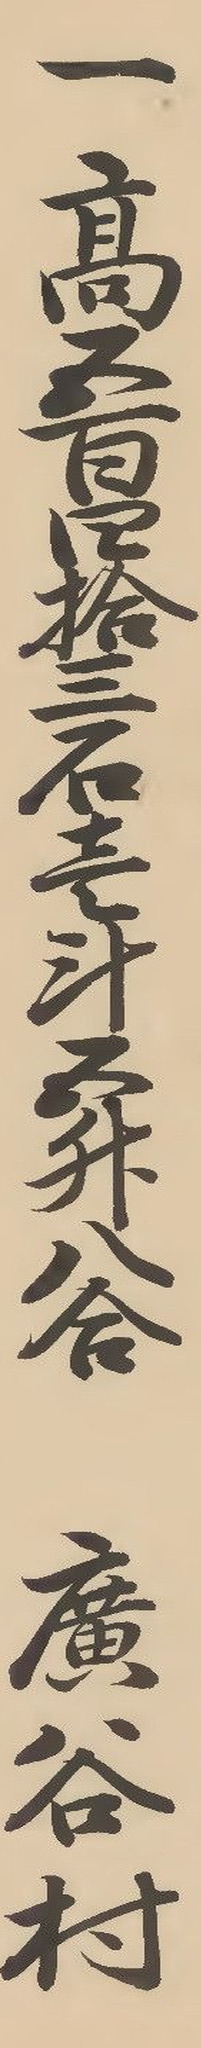一高五百四拾三石壱斗五升八合広谷村
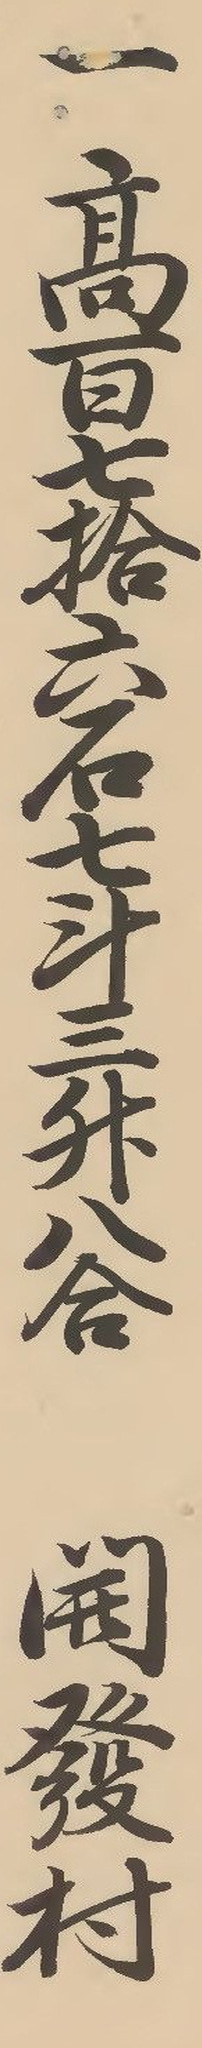一高百七拾六石七斗三升八合開発村
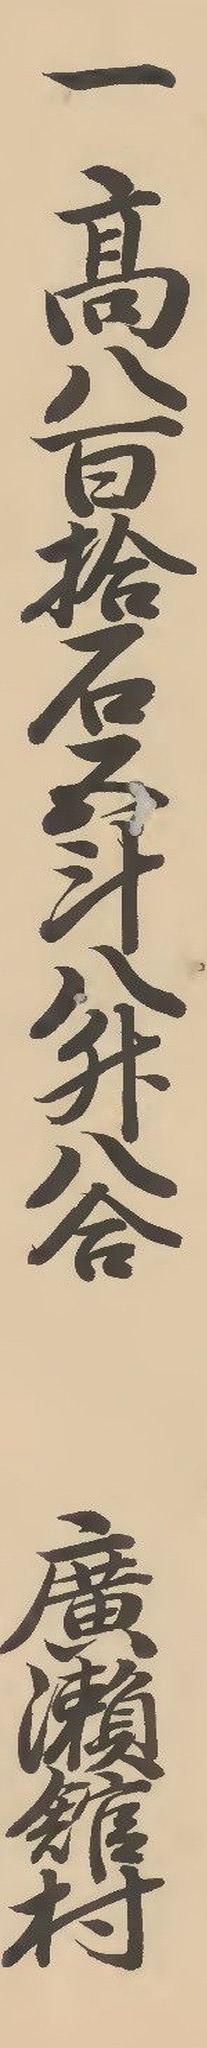一高八百拾石五斗八升八合広瀬館村
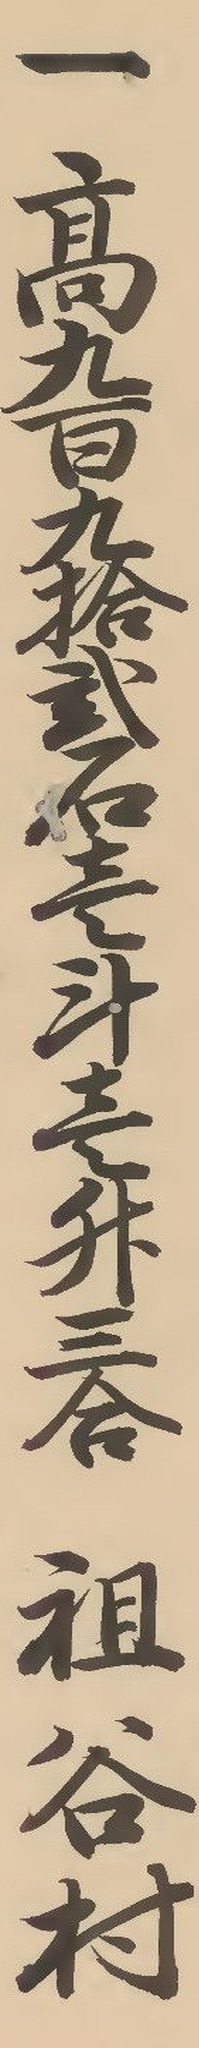一高九百九拾弐石壱斗壱升三合祖谷村
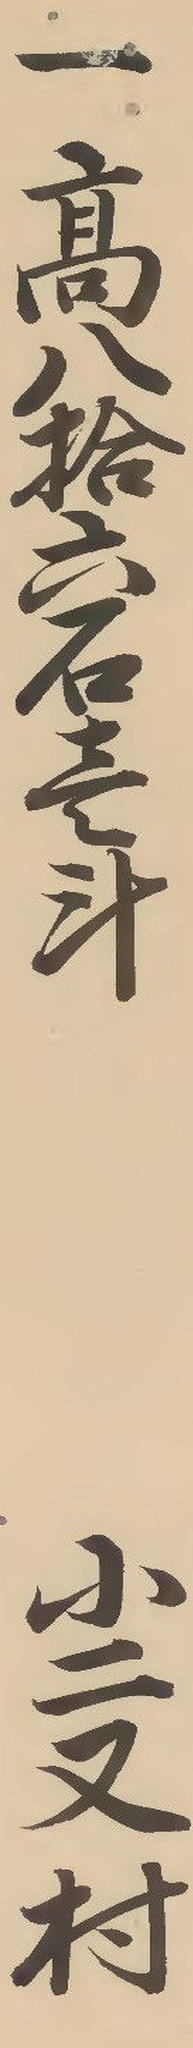一高八拾六石壱斗小二又村
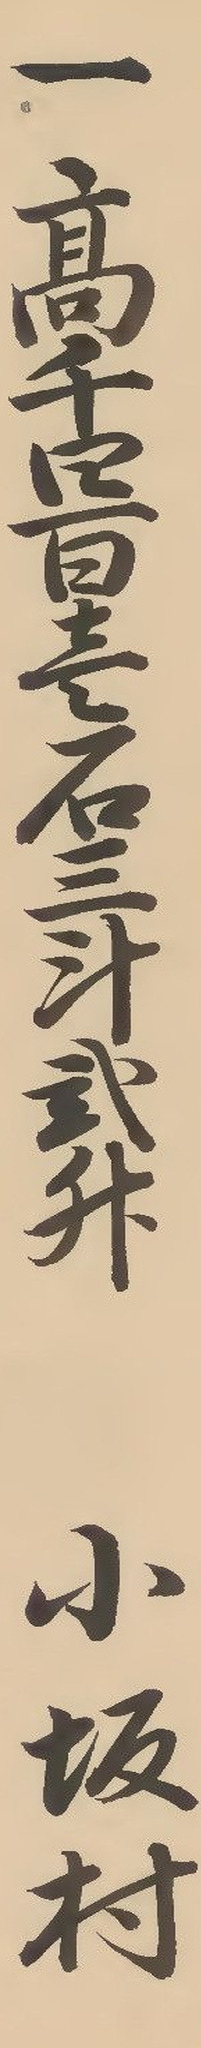一高千四百壱石三斗弐升小坂村
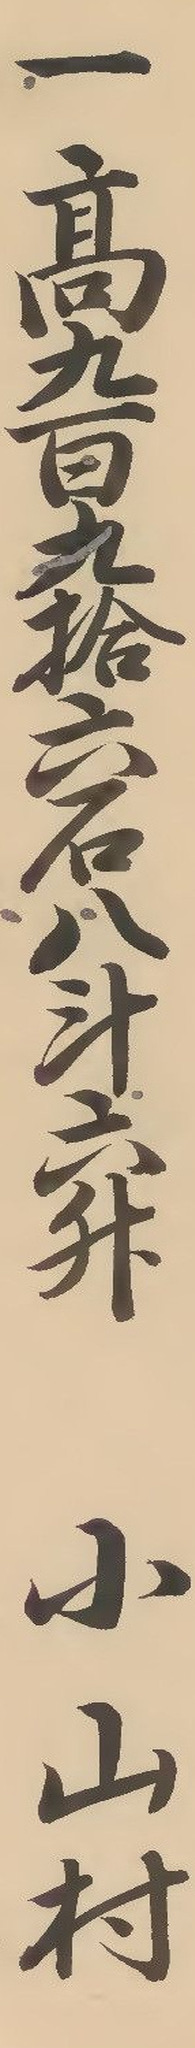一高九百九拾六石八斗六升小山村

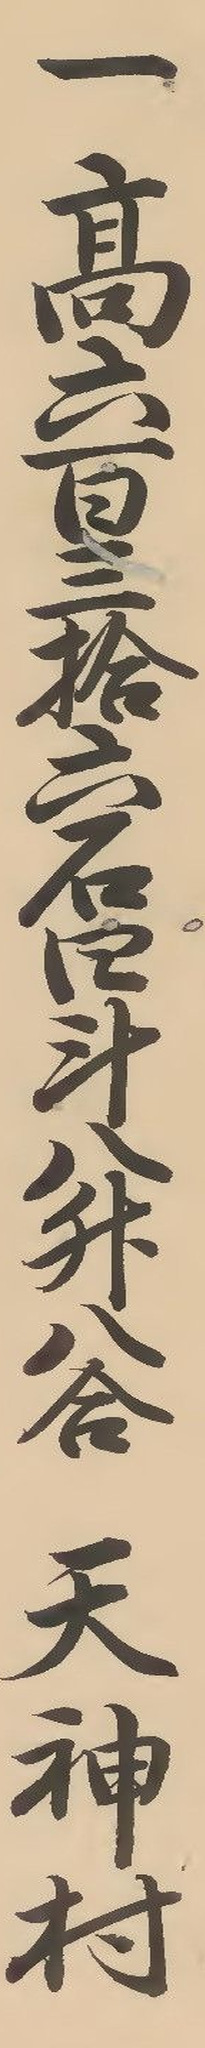一高六百三拾六石四斗八升八合天神村
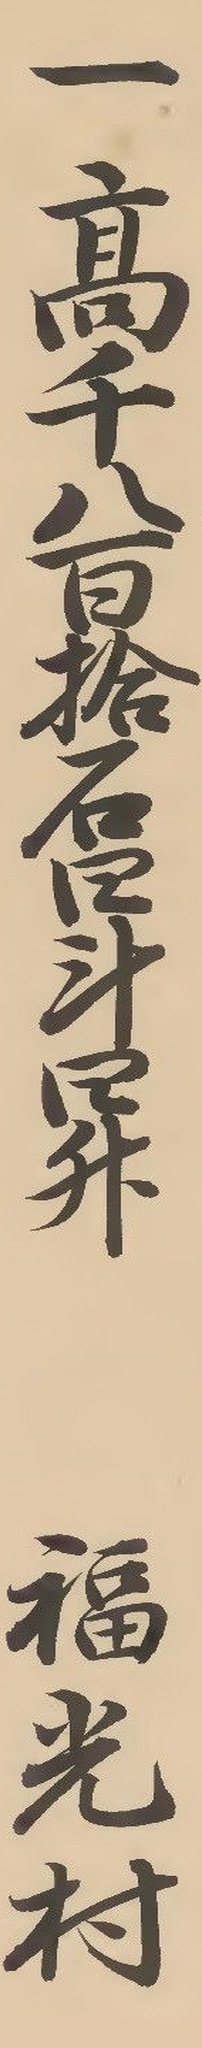一高千八百拾石四斗四升福光村
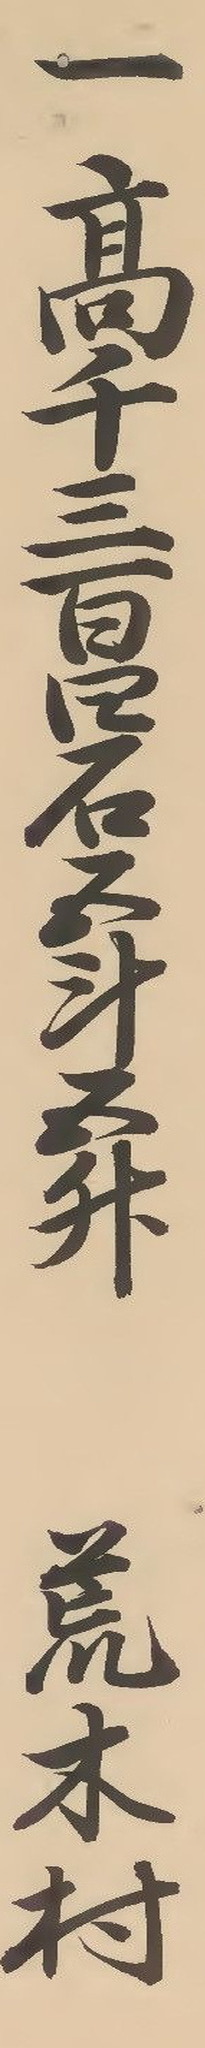一高千三百四石五斗五升荒木村
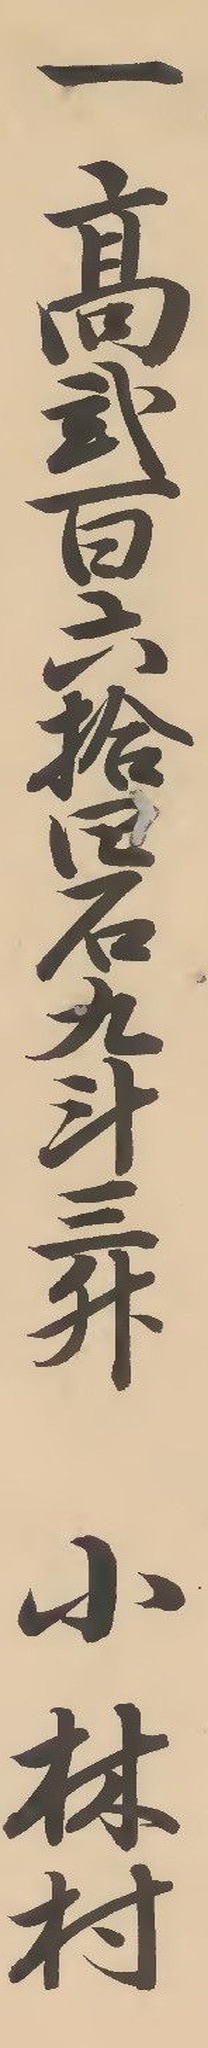一高弐百六拾四石九斗三升小林村
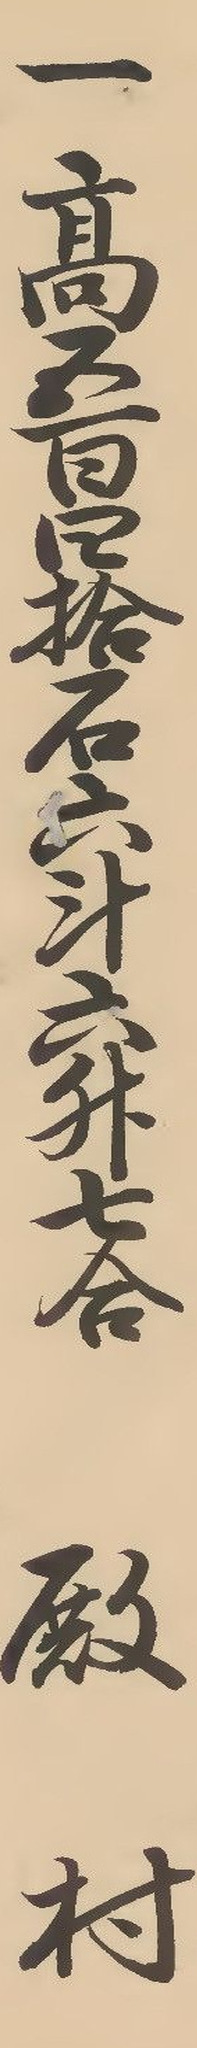一高五百四拾石六斗六升七合殿村
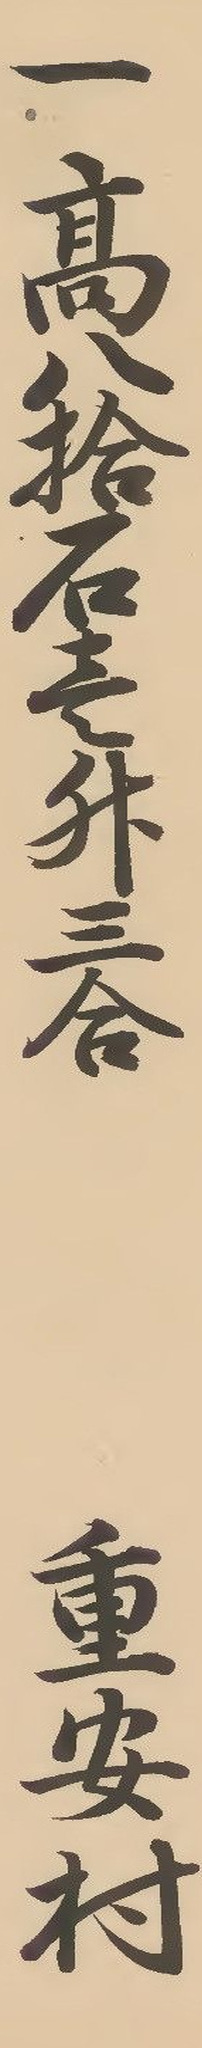一高八拾石壱升三合重安村

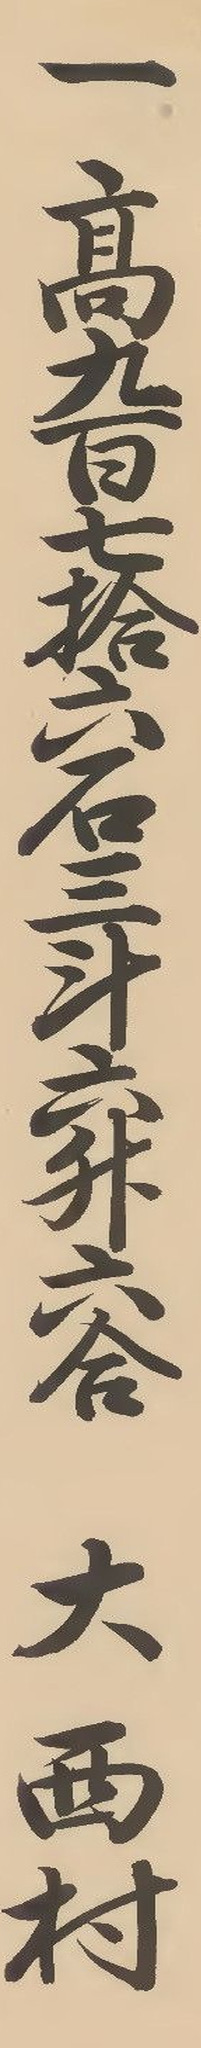一高九百七拾六石三斗六升六合大西村
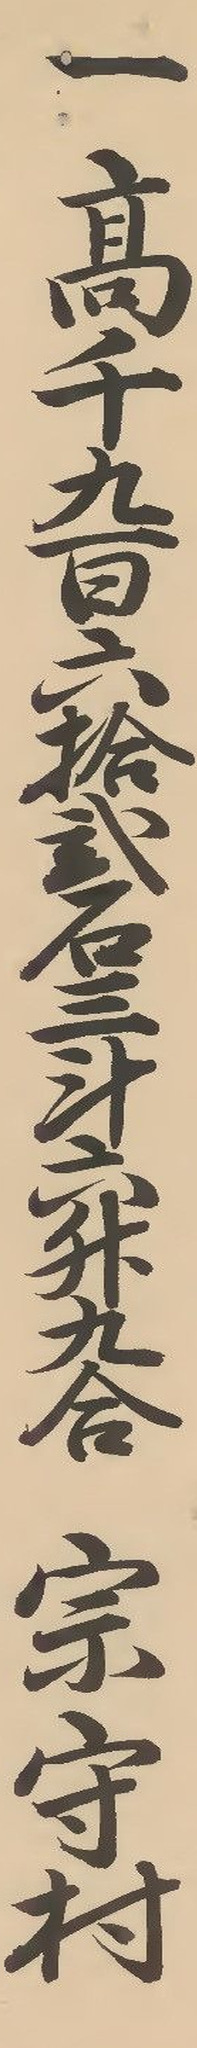一高千九百六拾弐石三斗六升九合宗守村
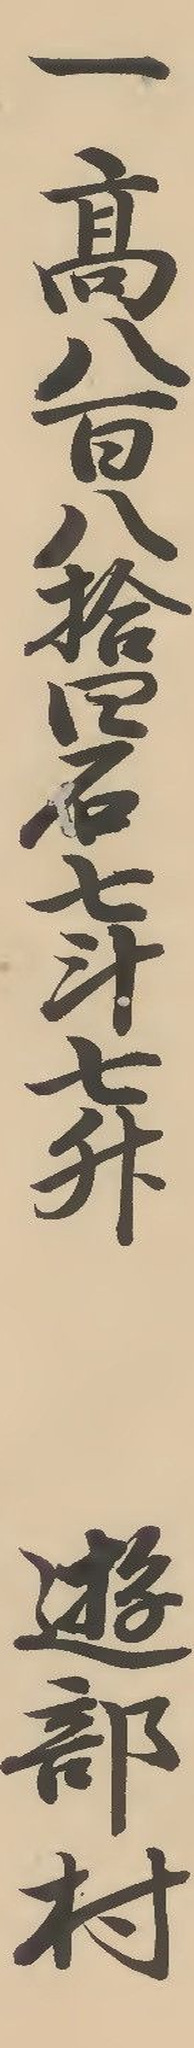一高八百八拾四石七斗七升遊部村
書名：越中国郷帳
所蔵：国立公文書館 National Archives of Japan
